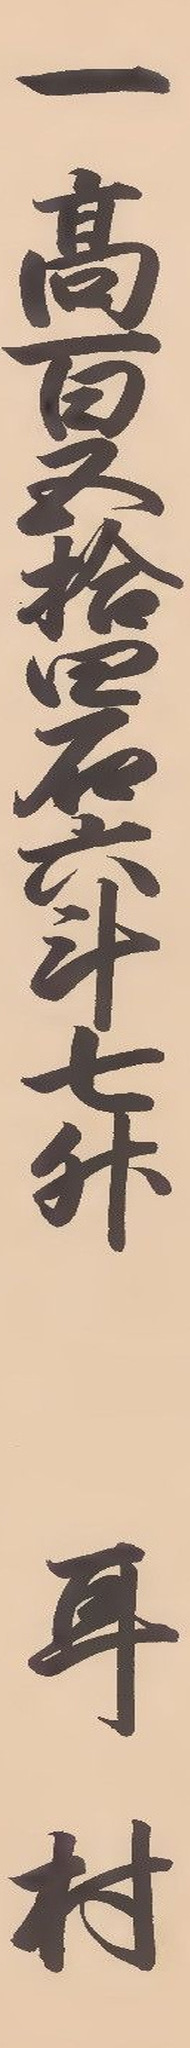一高百五拾四石六斗七升耳村
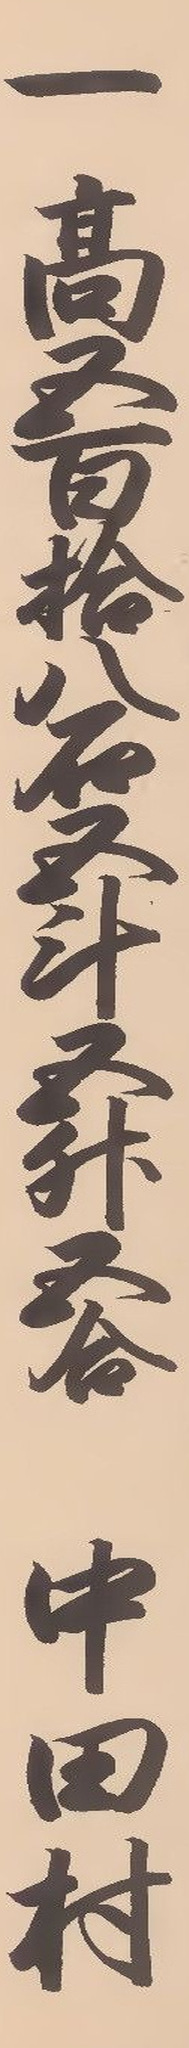一高五百拾八石五斗五升五合中田村
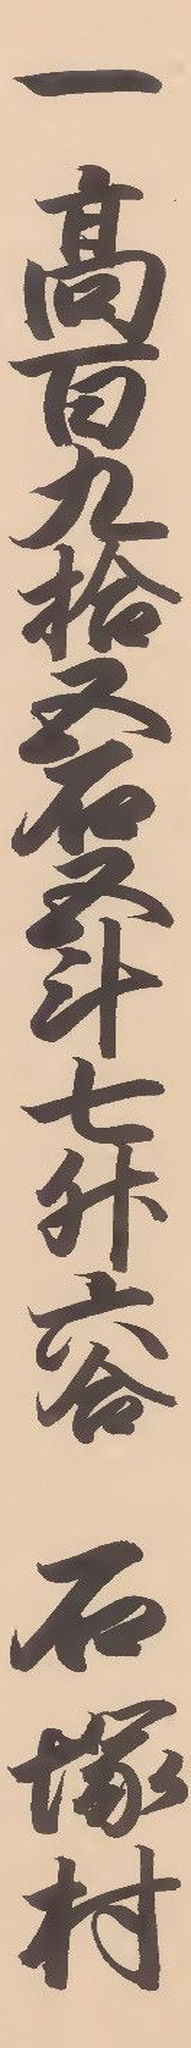一高百九拾五石五斗七升六合石塚村
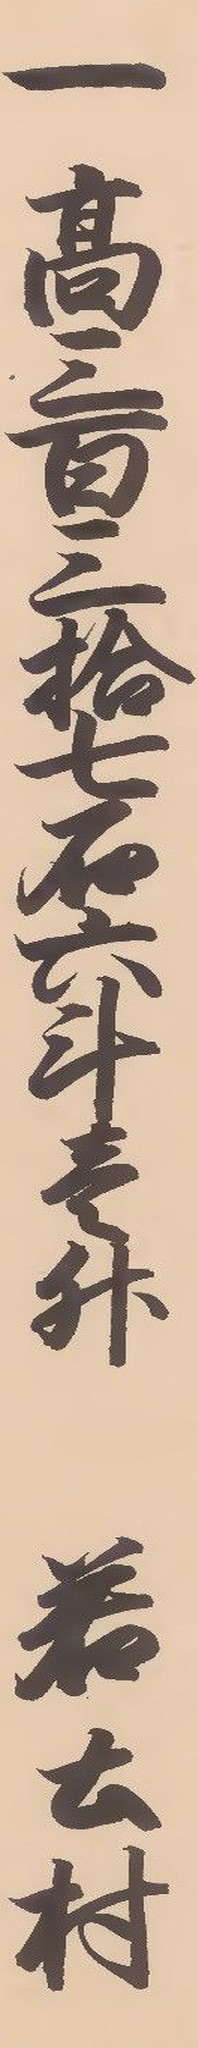一高三百三拾七石六斗壱升若土村

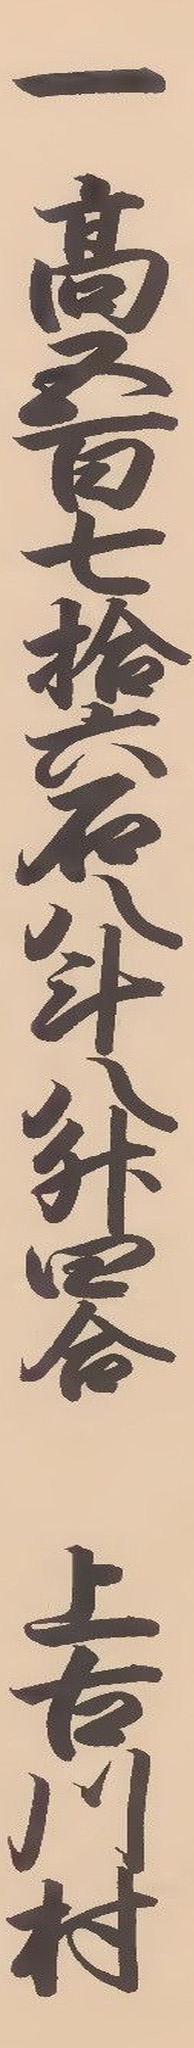一高五百七拾六石八斗八升四合上古川村
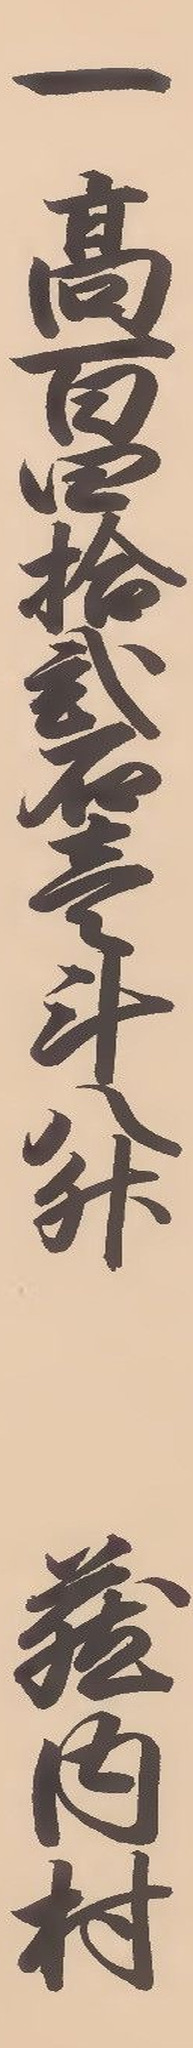一高百四拾弐石壱斗八升蔵内村
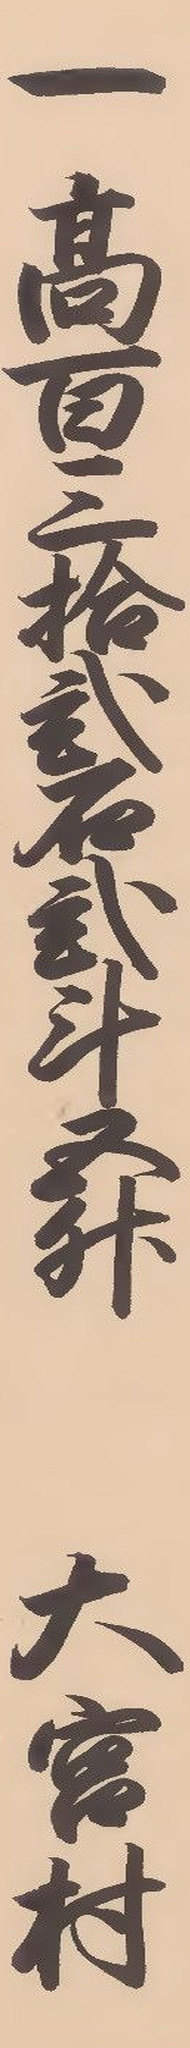一高百三拾弐石弐斗五升大宮村
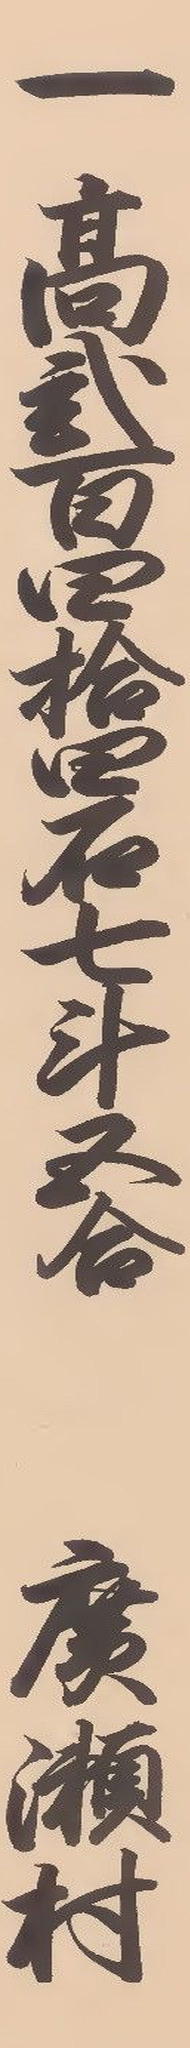一高弐百四拾四石七斗五合広瀬村
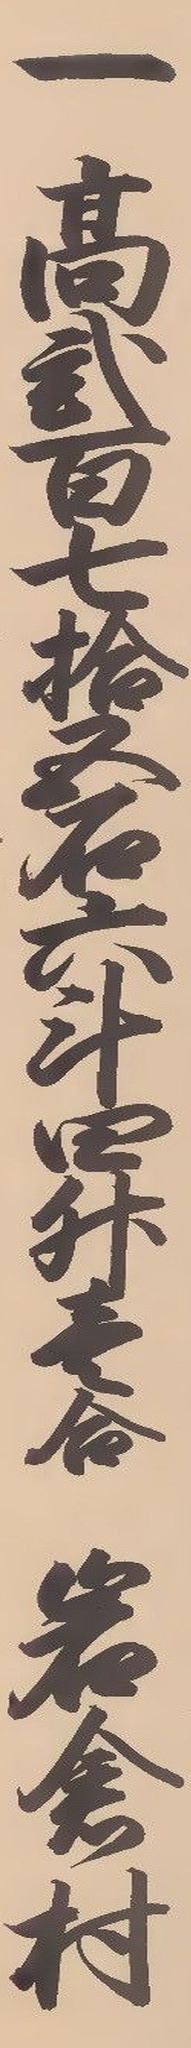一高弐百七拾五石六斗四升壱合岩倉村
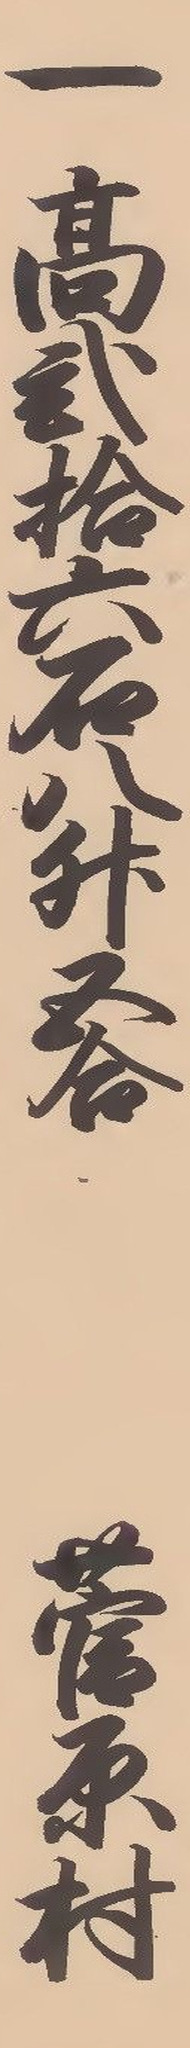一高弐拾六石八升五合菅原村
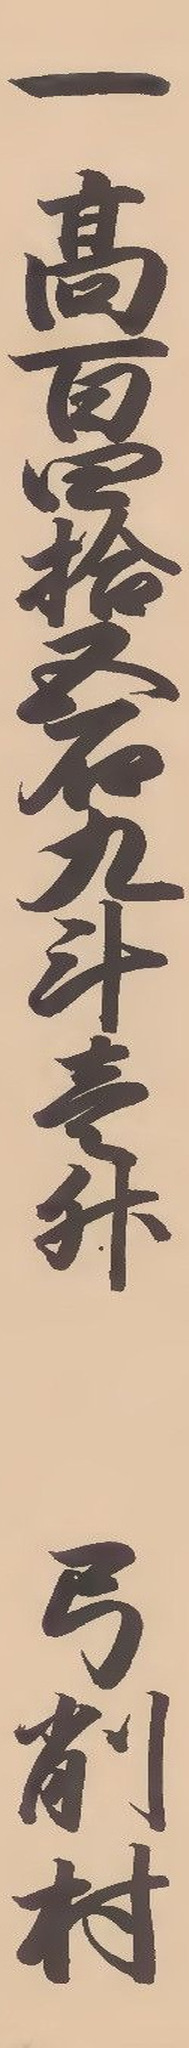一高百四拾五石九斗壱升弓削村
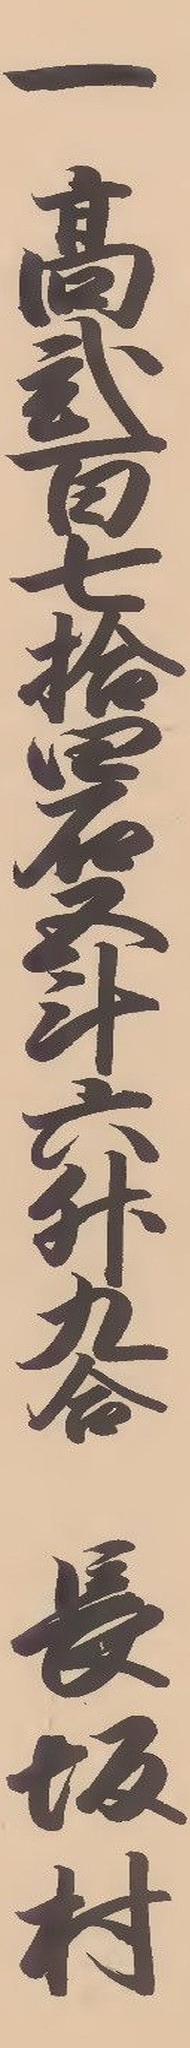一高弐百七拾四石五斗六升九合長坂村

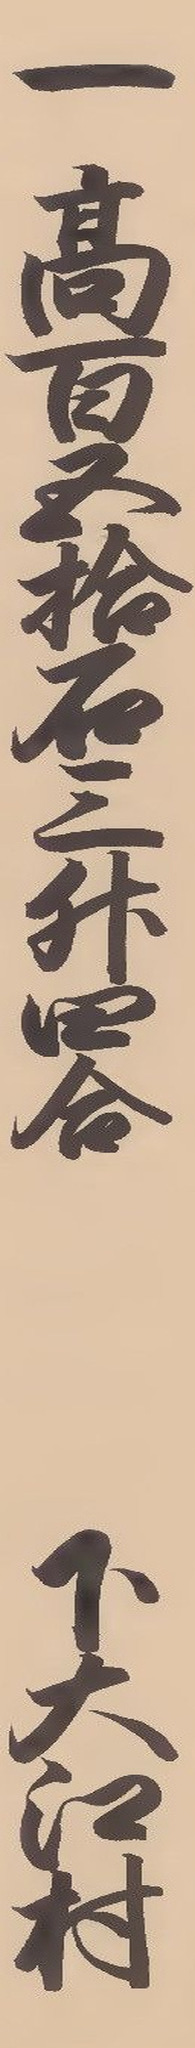一高百五拾石三升四合下大江村
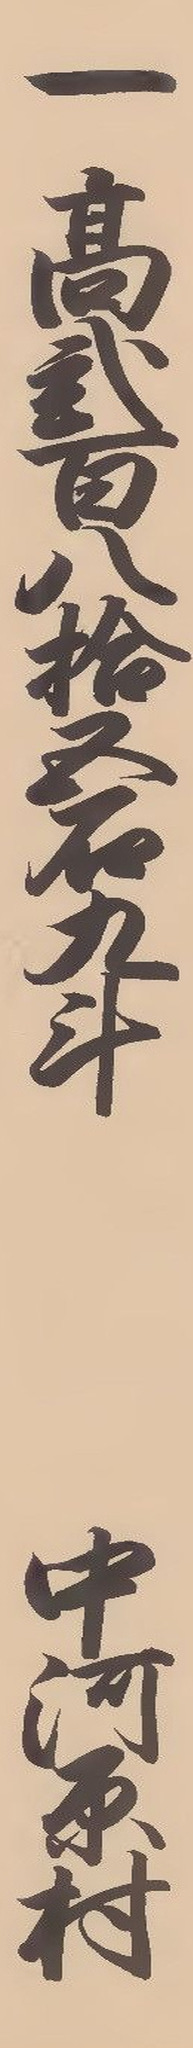一高弐百八拾五石九斗中河原村
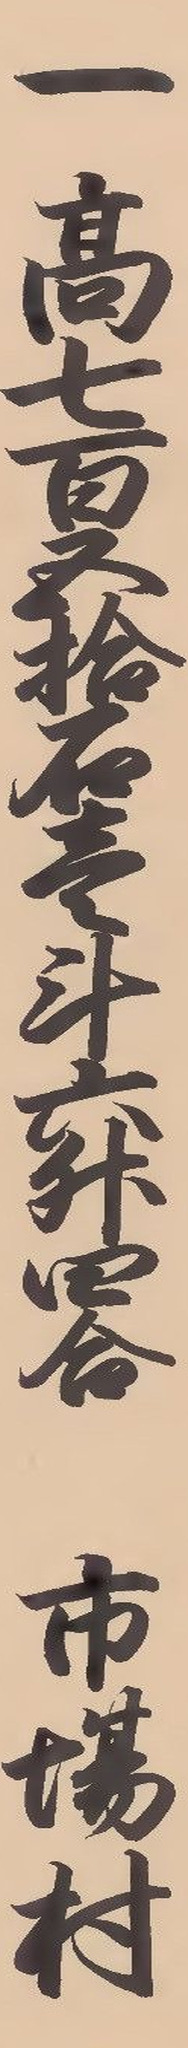一高七百五拾石壱斗六升四合市場村
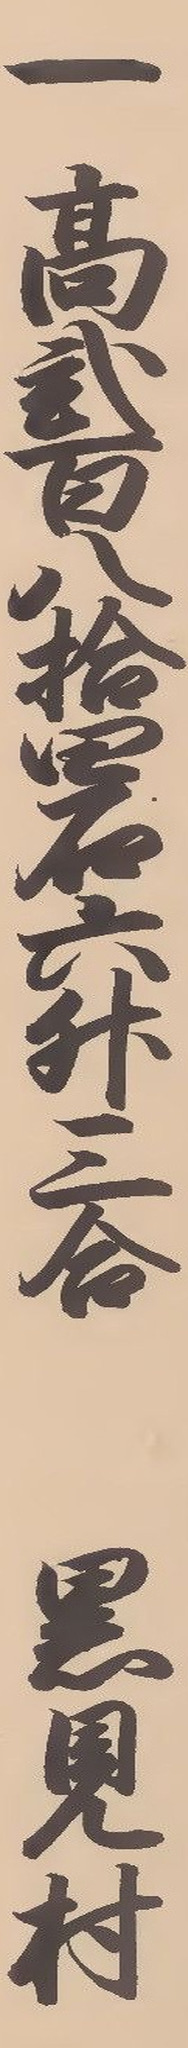一高弐百八拾四石六升三合黒見村
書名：伯耆国郷帳
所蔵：国立公文書館 National Archives of Japan
